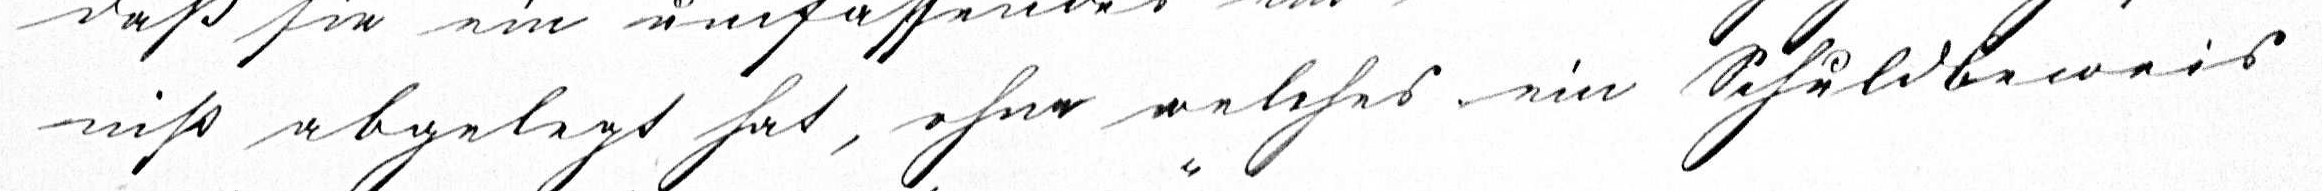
niß abgelegt hat, ohne welche sein Schuldbeweis
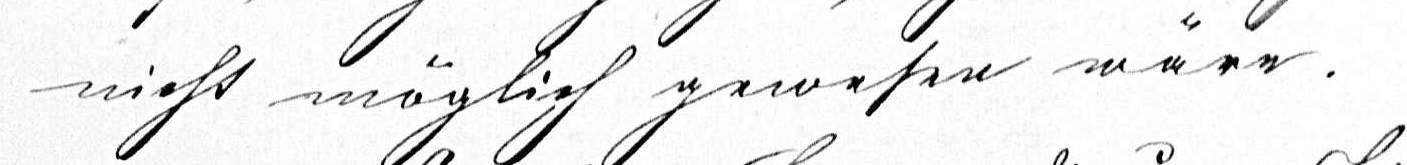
nicht möglich gewesen wäre.
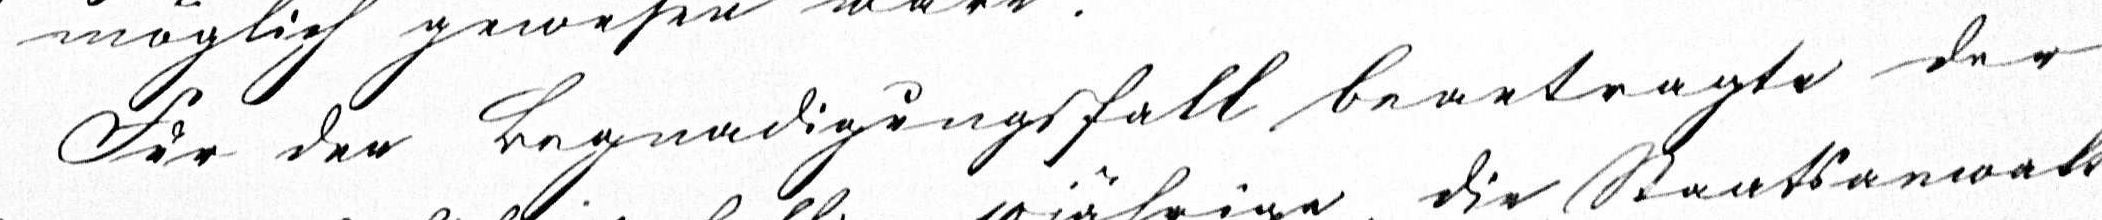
Für den Begnadigungsfall beantragte der
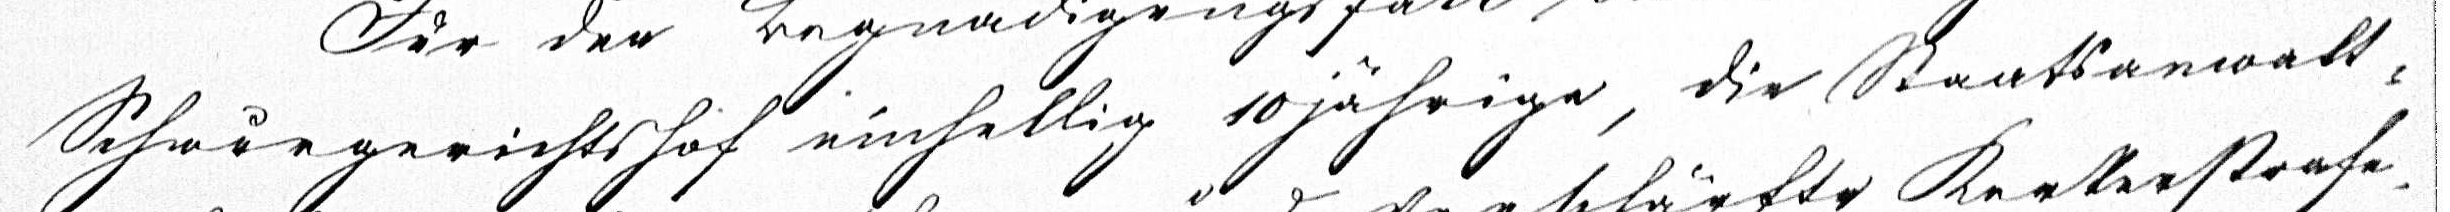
Schwurgerichtshof einhellig 10jährige,die Staatsanwalt¬
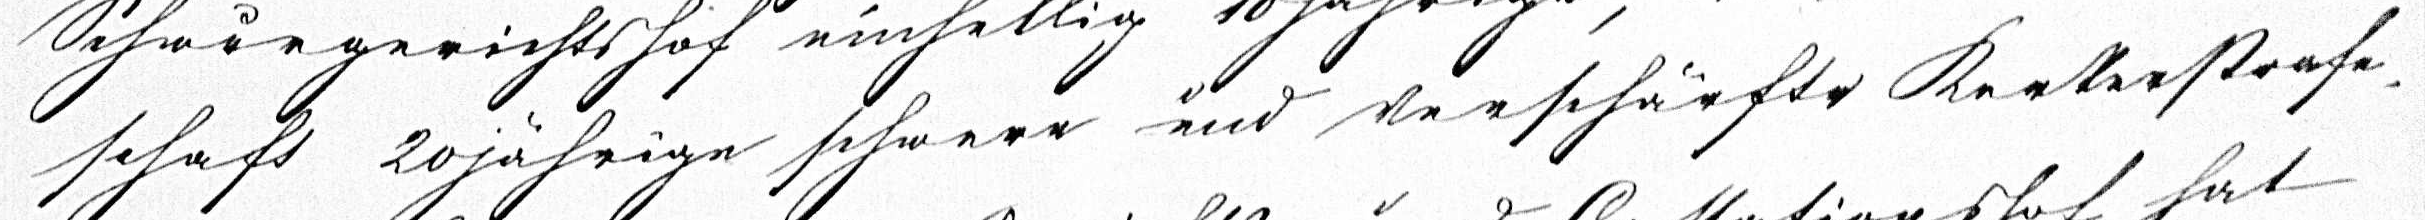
schaft 20jährige schwere und verschärfte Kerkerstrafe.
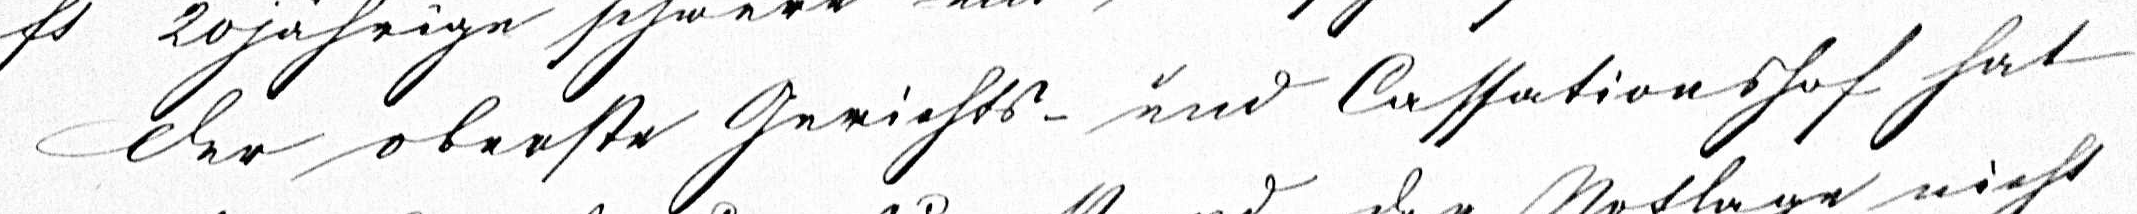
Der oberste Gerichts- und Cassationshof hat
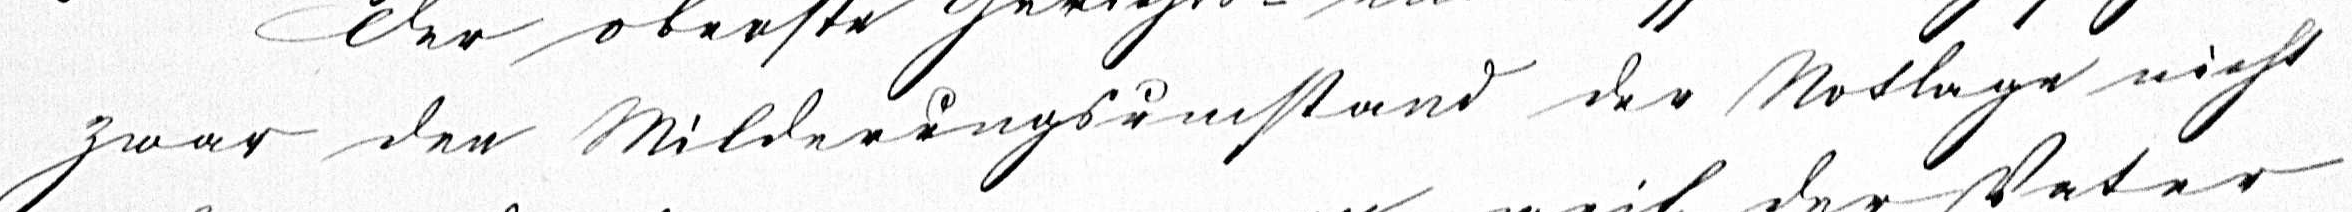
zwar den Milderungsumstand der Notlage nicht
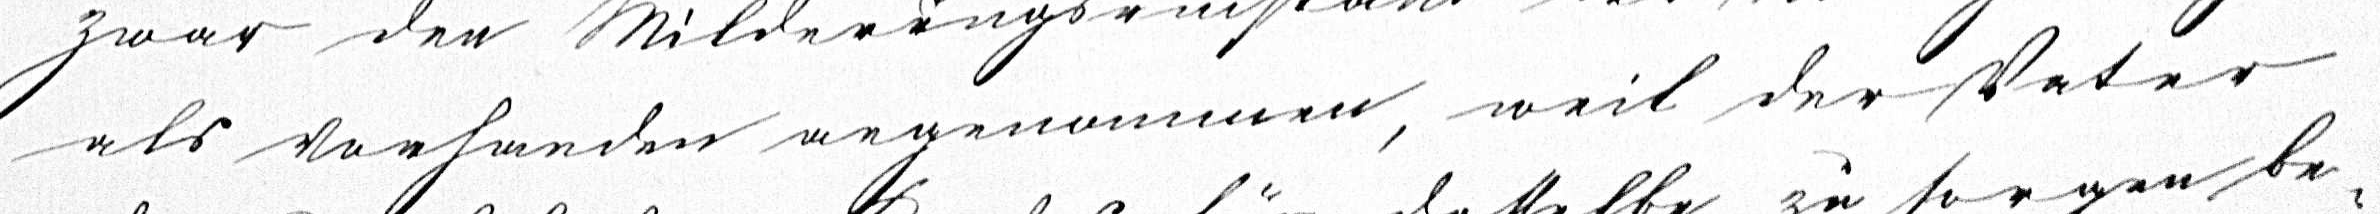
als vorhanden angenommen, weil der Vater
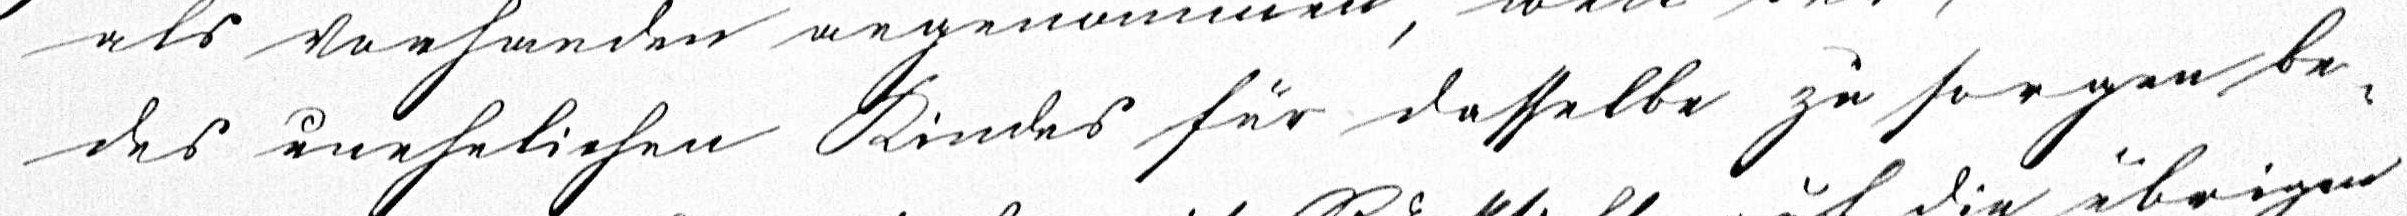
des unehelichen Kindes für dasselbe zu sorgen be¬
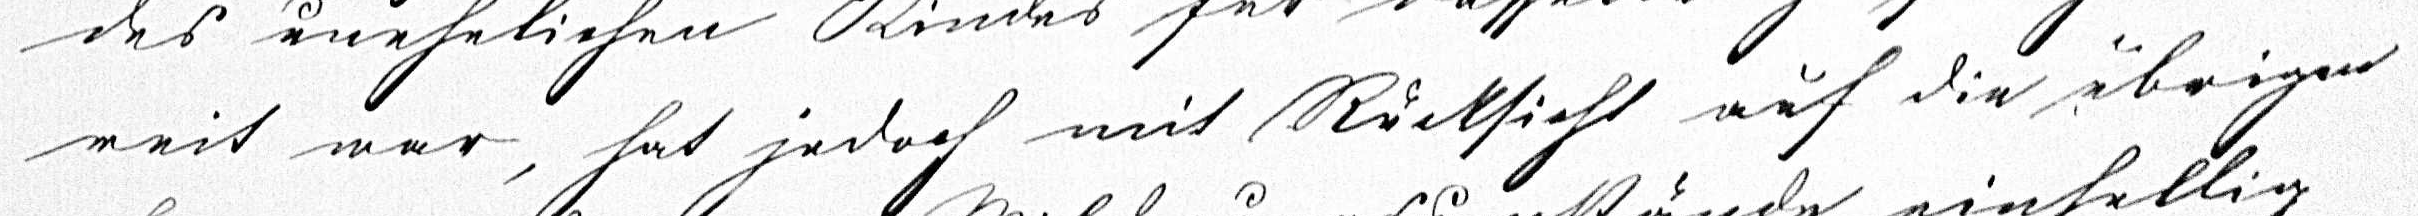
reit war, hat jedoch mit Rücksicht auf die übrigen
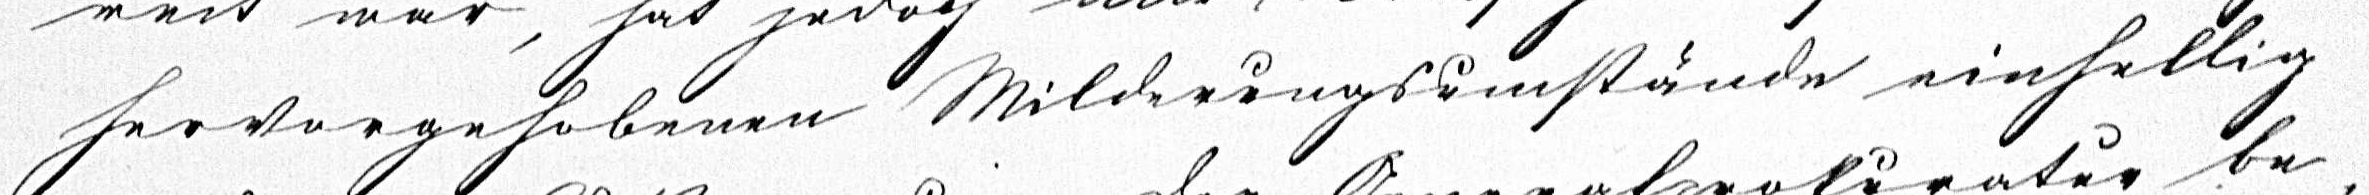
hervorgehobenen Milderungsumstände einhellig
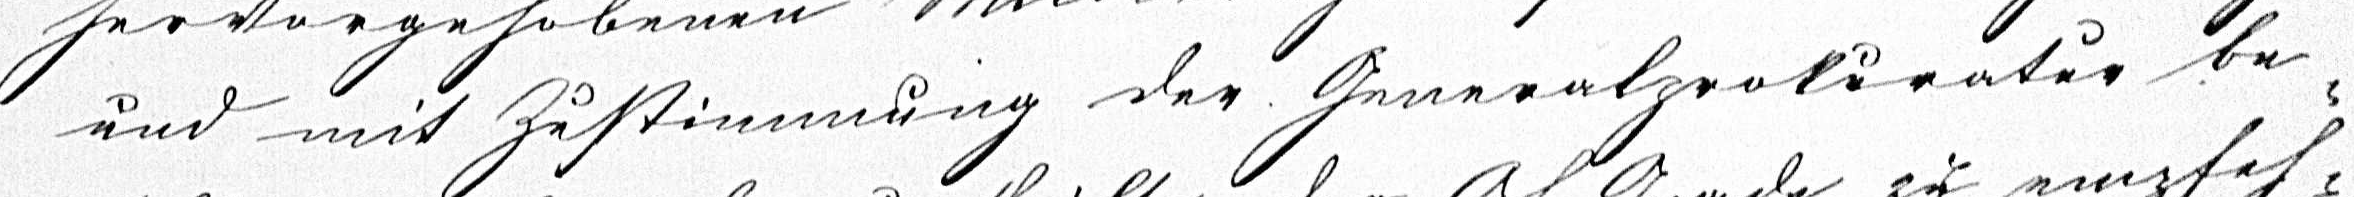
und mit Zustimmung der Generalprokuratur be¬
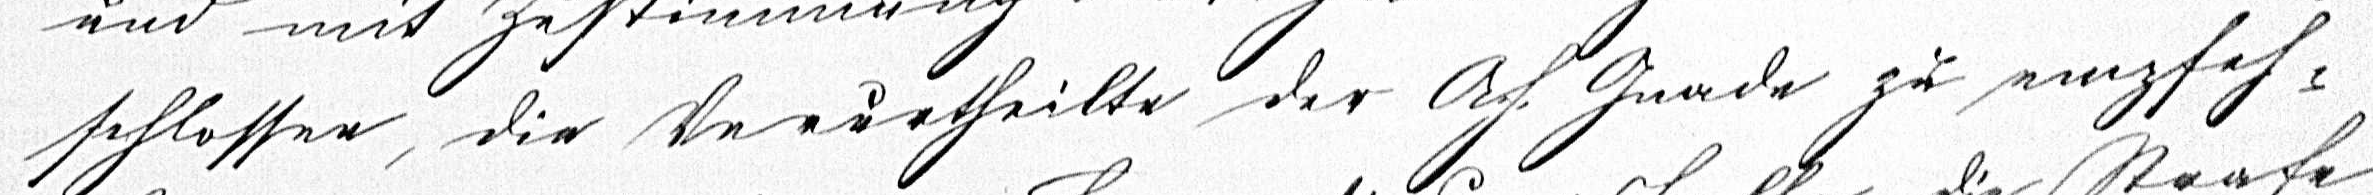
schlossen, die Verurtheilte der A.h. Gnade zu empfeh¬
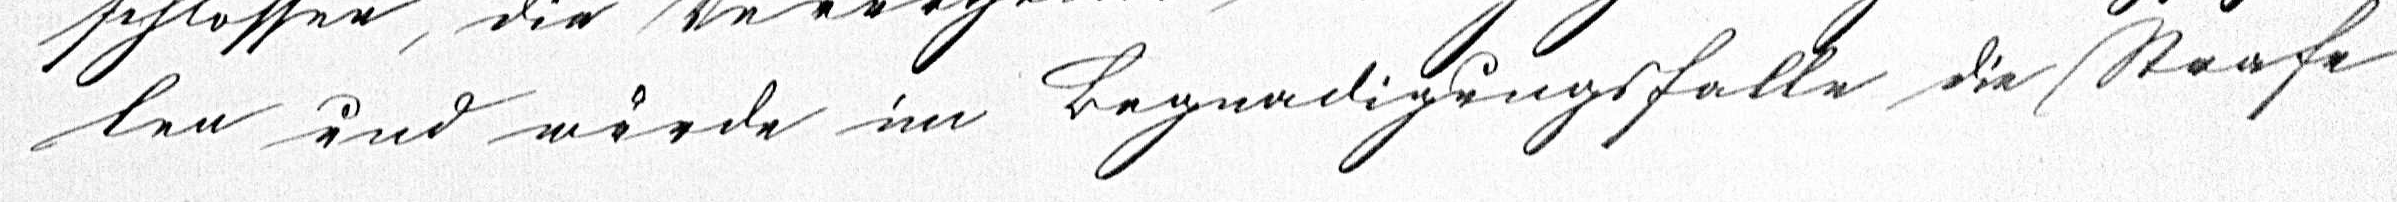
len und würde im Benadigungsfalle die Strafe
